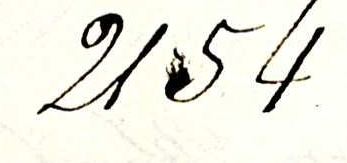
2154
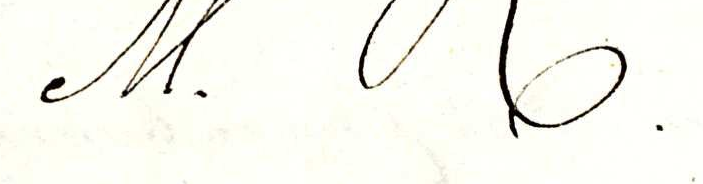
M. R.
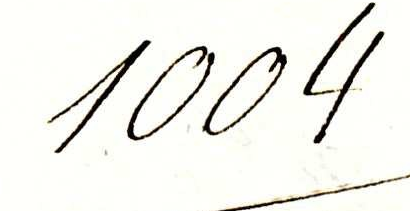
1004
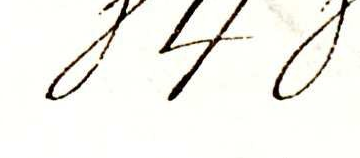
848
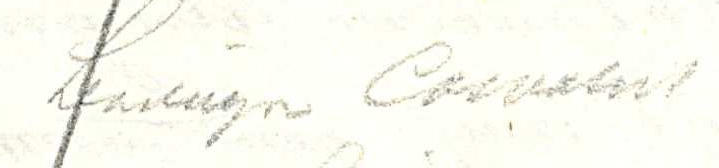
Beduge Convalut
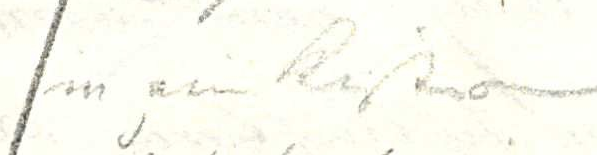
in ein Rßes
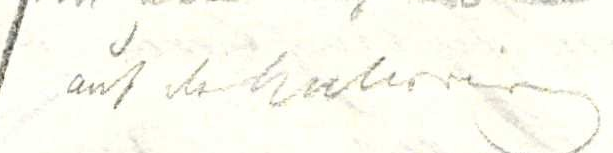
auf dekelerin
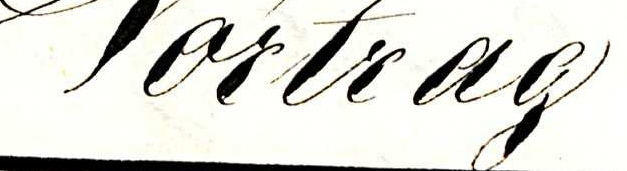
Vortrag
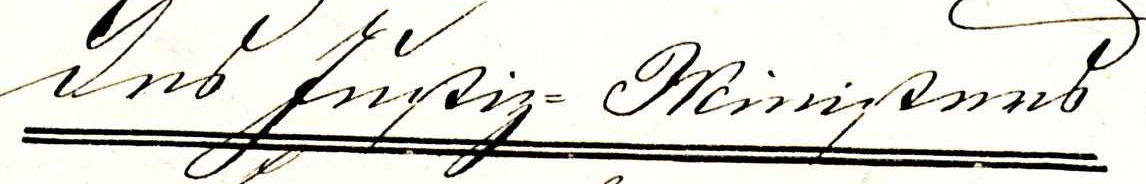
des Justi-Ministers
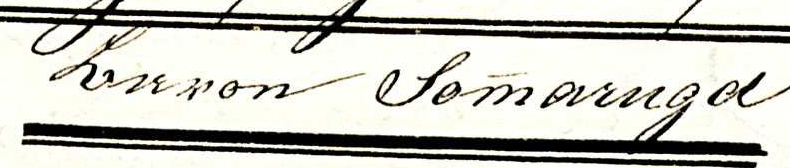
Baron Sommaruga
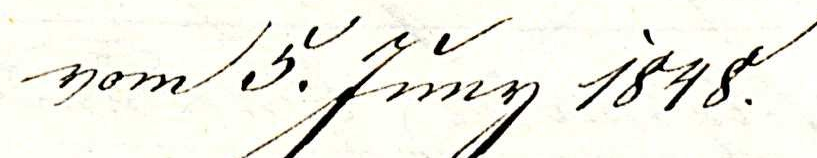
vom 5. Juny 1848.
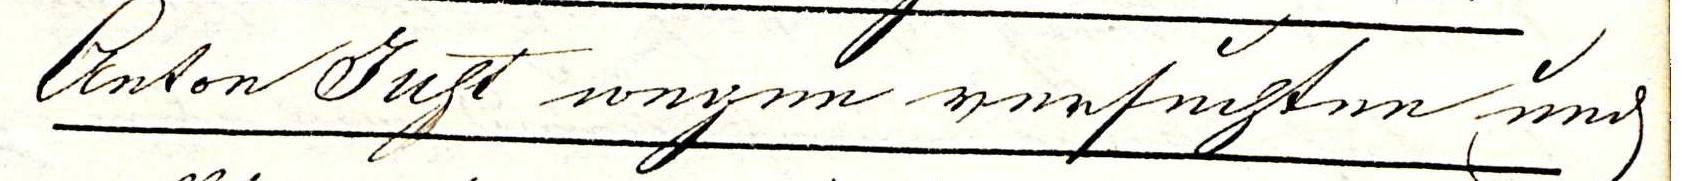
Anton Just wegen versuchten auch
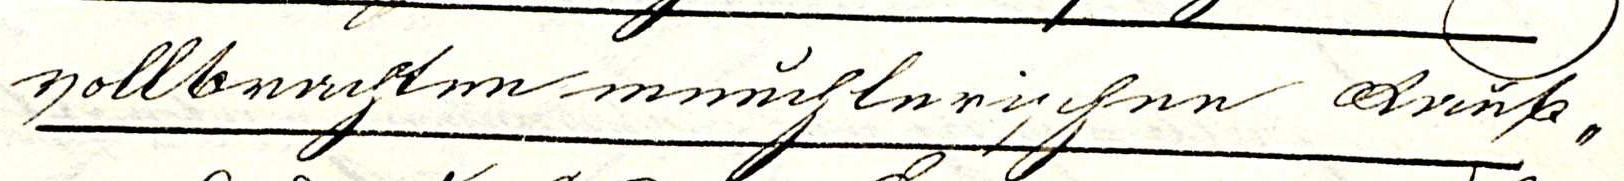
vollbrachten meuchlerischen Raub¬
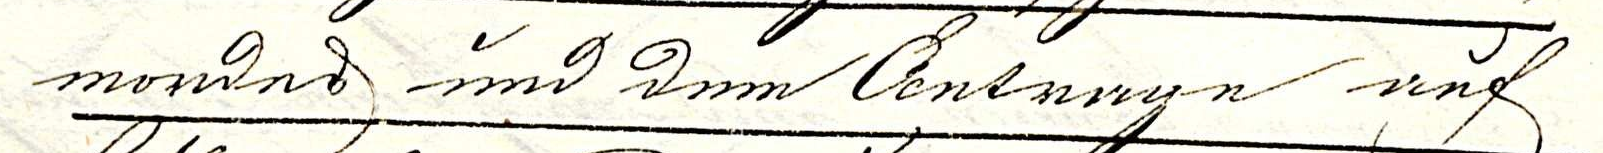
mordes und dem Antrage auf
